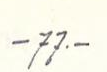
77
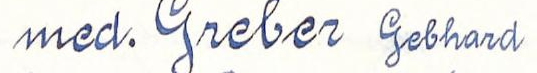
med. Greber Gerhard
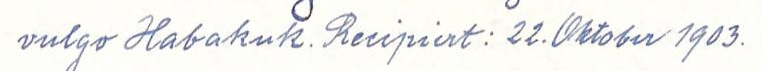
vulgo Habakuk. Recipiert:22. Oktober 1903.
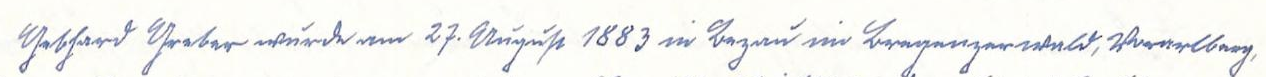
Gebhard Greber wurde am 27. August 1883 in Bezau im Bregenzerwald, Vorarlberg,
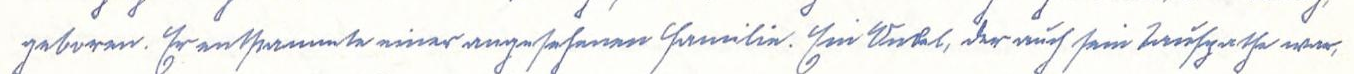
geboren. Er entstammte einer angesehenen Familie. Ein Onkel, der auch sein Taufpate war,
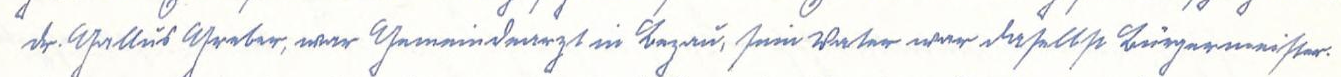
Dr. Gallus Greber, war Gemeindearzt in Bezau, sein Vater war da selbst Bürgermeister.
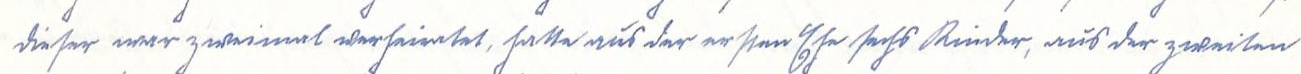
Dieser war zweimal verheiratet, hat aus der ersten Ehe sechs Kinder, aus der zweiten
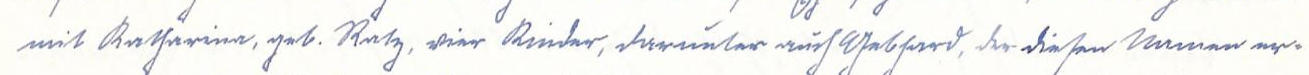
mit Katharina geb. Ratz, vier Kinder, darunter auch Gebhard, der diesen Namen er-
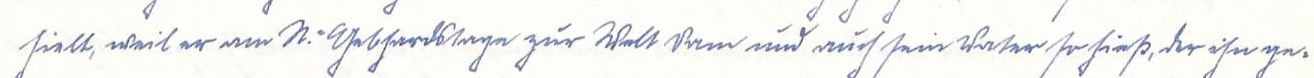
hielt, weil er am St. Gebhardstag zur Welt kam und auch sein Vater sohieß, der ihn ge-
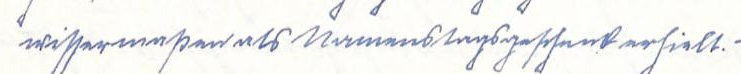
wissermaßen als Namenstagsgeschenk erhielt.-
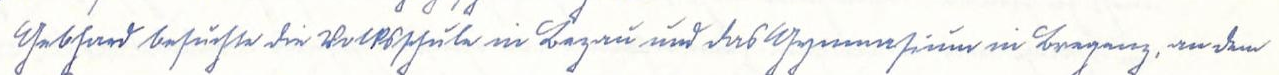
Gebhard besuchte die Volksschule in Bezau, das Gymnasium in Bregenz, an dem
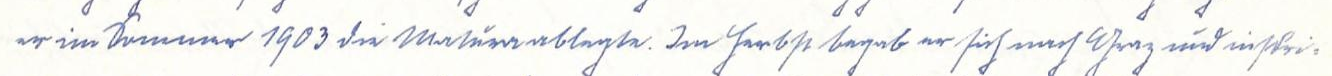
er im Sommer 1903 die Matura ablegte. Im Herbst begab es sich nach Graz und inskri-
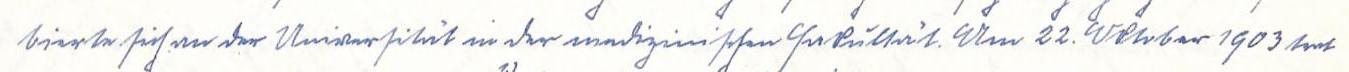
bierte sich an der Universität in der medizinischen Fakultät. Am 22. Oktober 1903 trat
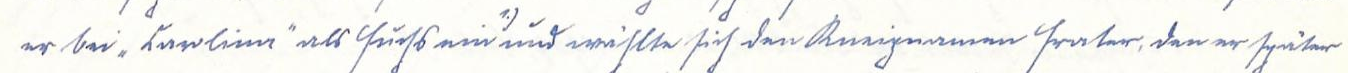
er bei „Carolina“ als Fuchs ein 1) und wählte den Kneipnamen Frater, den er später
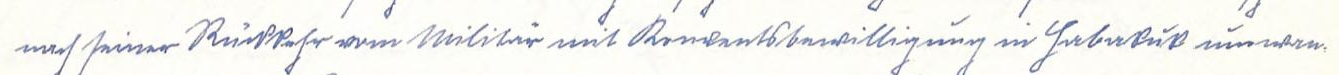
nach seiner Rückkehr vom Militär mit Konventsbewilligung in Habakuk umwan-
